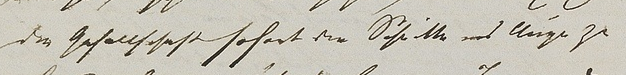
die Gesellschaft sofort die Schritte ins Auge zu
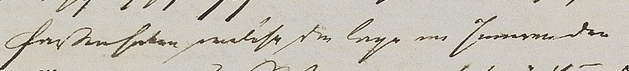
faßen haben welche die Lage im Innern der
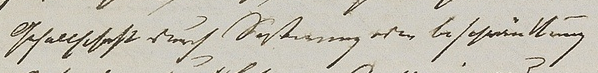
Gesellschaft durch Sistirung oder Beschränkung
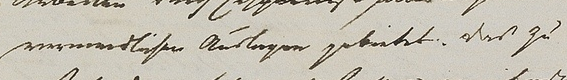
vermeidlichen Auslagen gebietet. Das zu
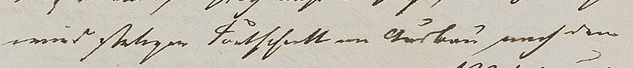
wird stetiger Fortschritt im Ausbau nach den
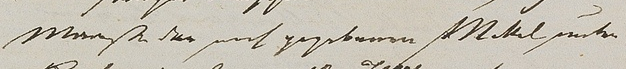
Maaßen der uns gegebenen Mittel unter
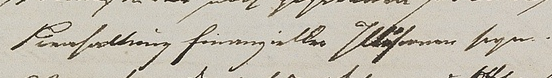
Fernhaltung finanzieller Illusionen seyn.
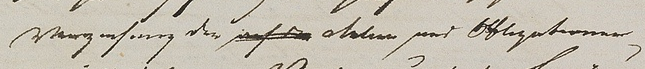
Verzeichnung der Actien und Obligationen
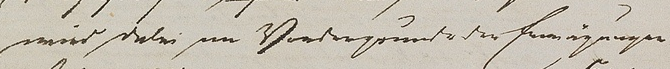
wird dabei im Vordergrunde der Erwägungen
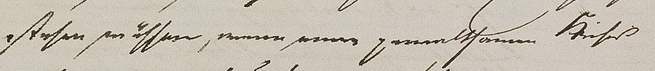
stehen müssen, wenn einer gewaltsamen Krisis
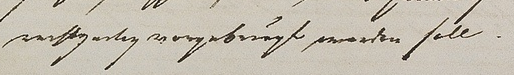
rechtzeitig vorgebeugt werden soll.
